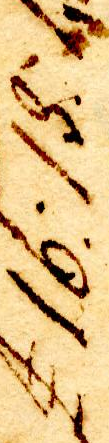£16: 13: 4
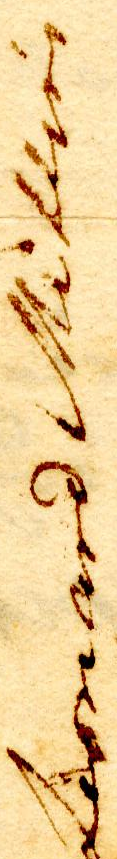Leonard Miller's
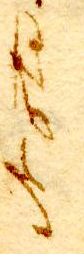Note
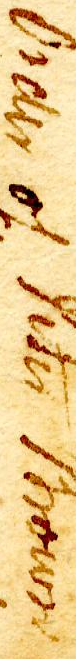Order of Peter Brown
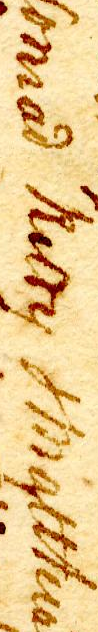Conrad Retty & Matthew
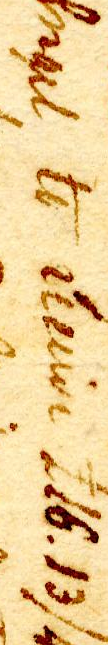Engel to receive £16.13/4
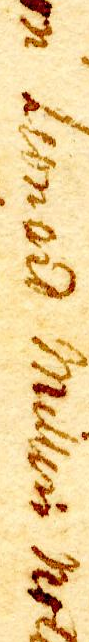on Leonard Miller's Note
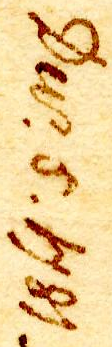Dec^r 5. 1781.
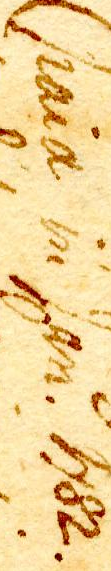(paid in Jan^y. 1782.
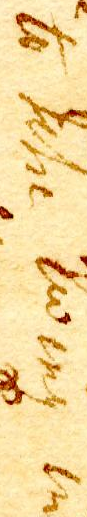to Luke Ewing in
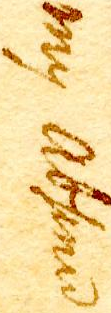my Absence)
